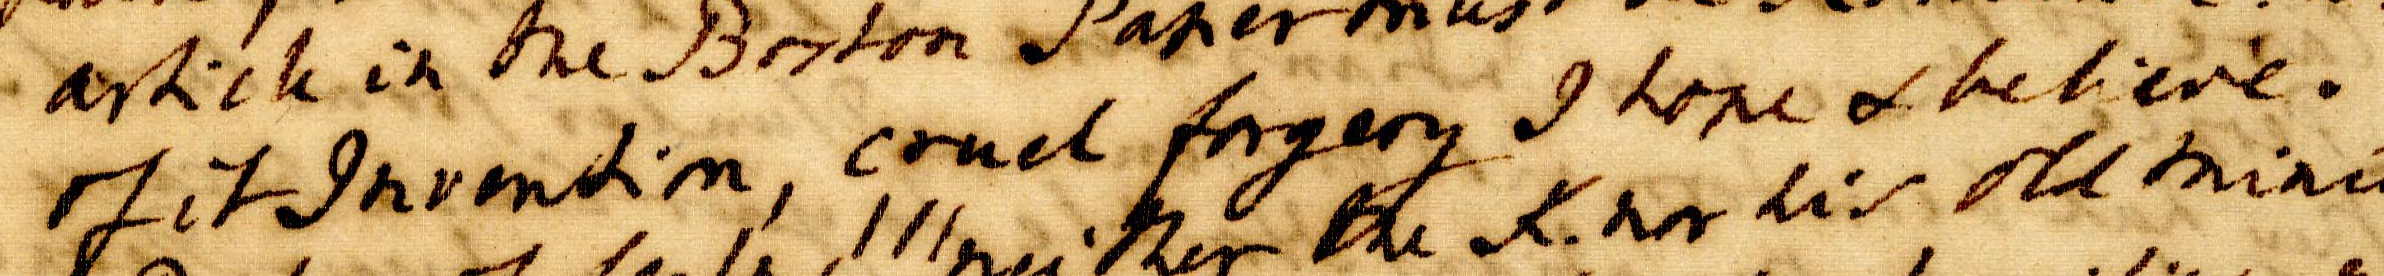of it Invention, cruel forgery I hope & believe.
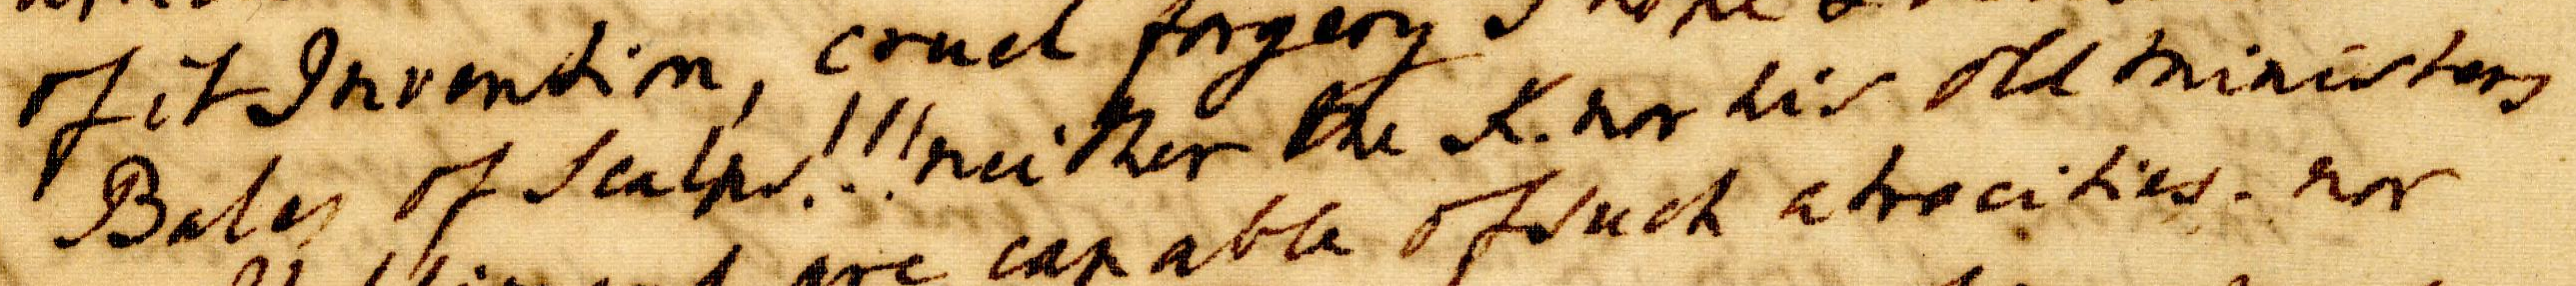Bales of scalps!!! neither the K. nor his old ministers
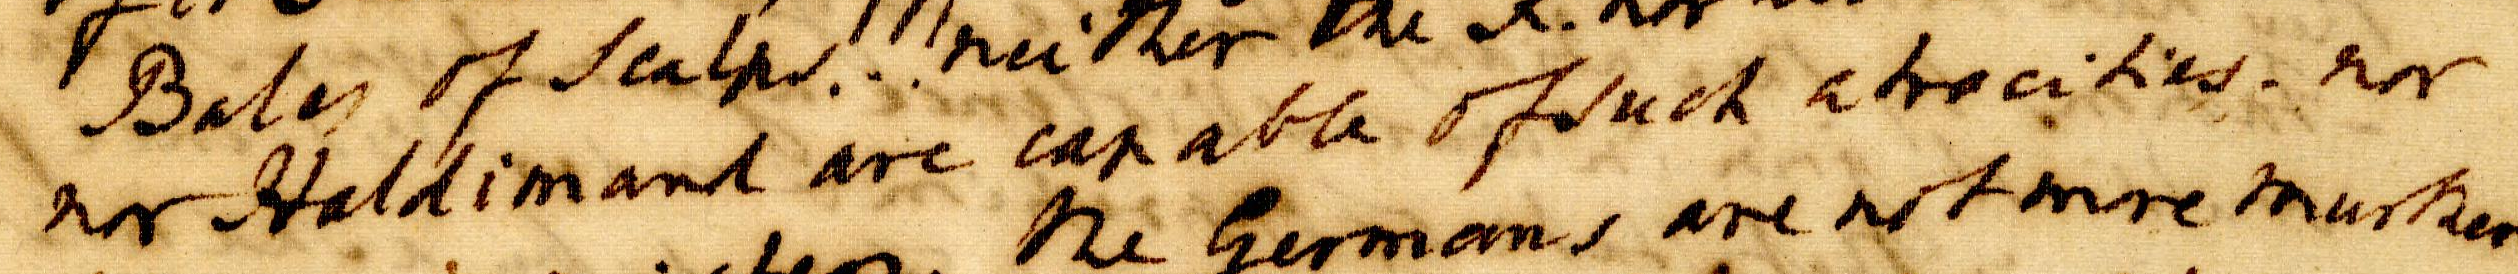nor Haldimand are capable of such atrocities. nor
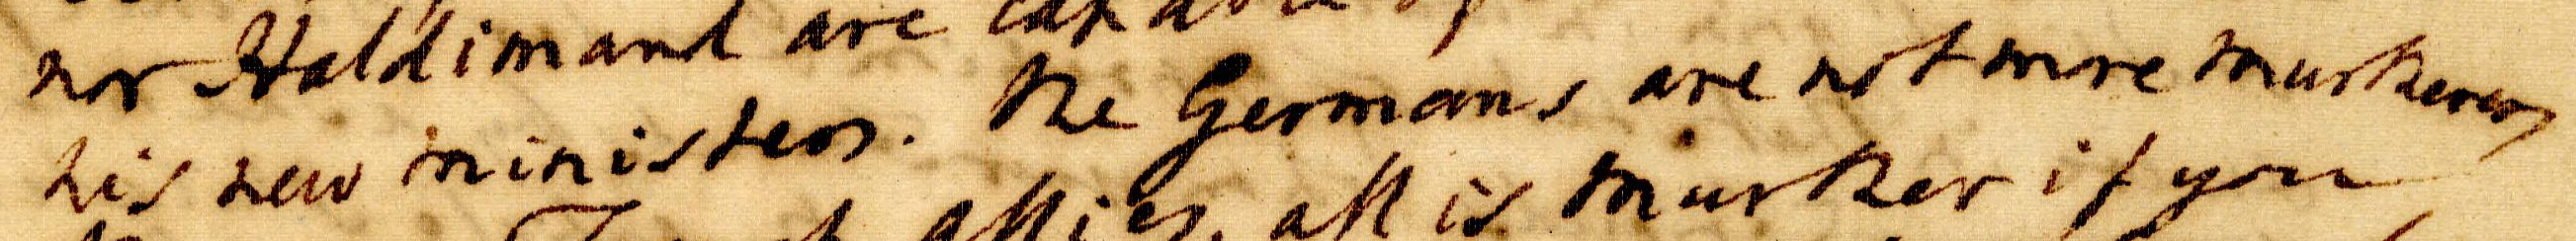his new ministers. The Germans are not more murderers
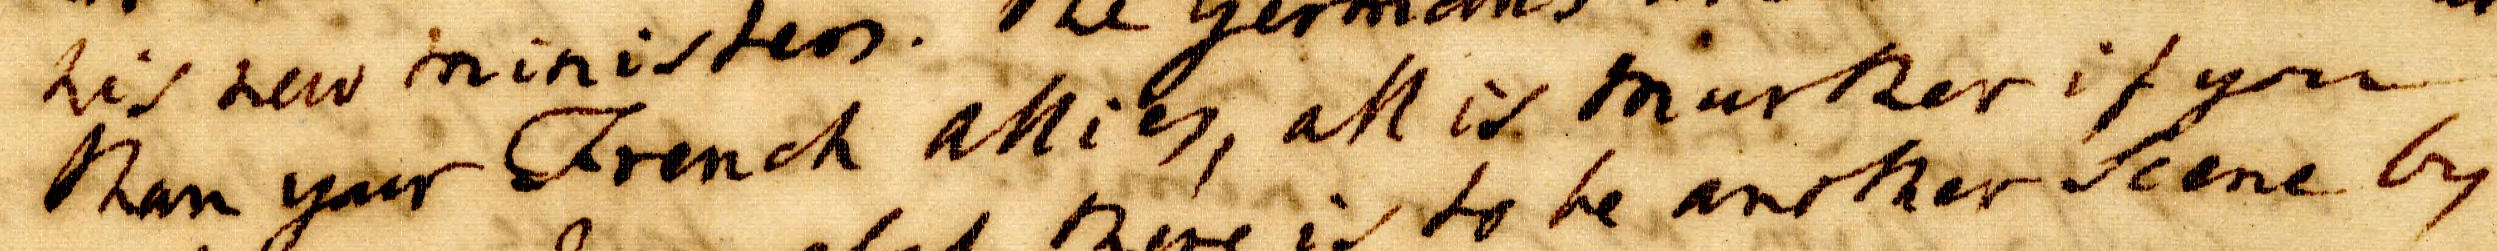than your French allies, all is murder if you
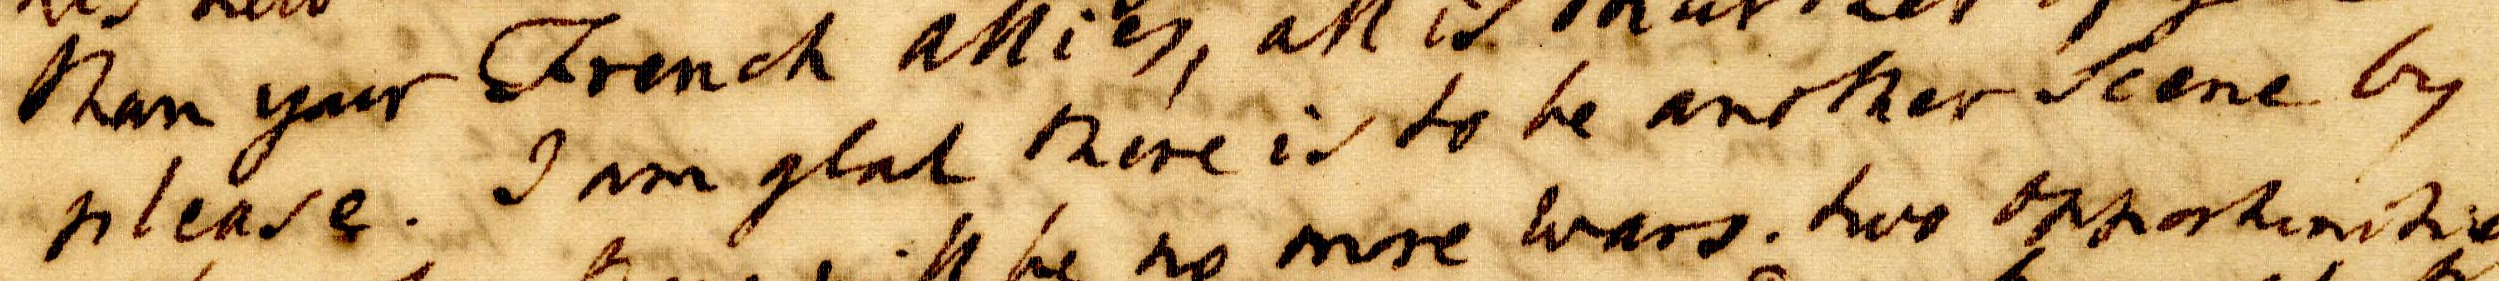please. I am glad there is to be another scene by
